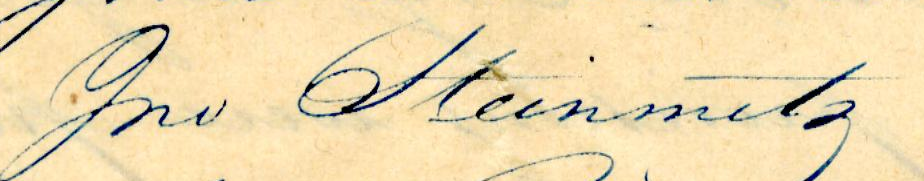Jno Steinmetz
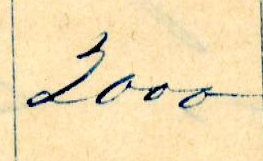2000
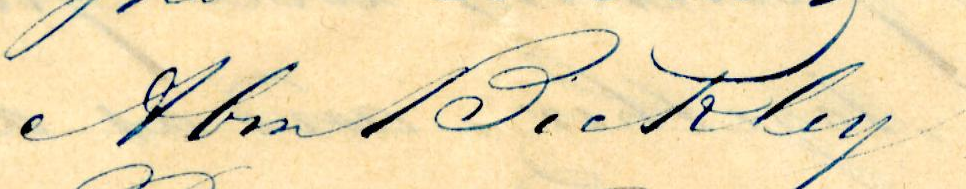Abm Bickley
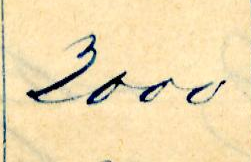2000
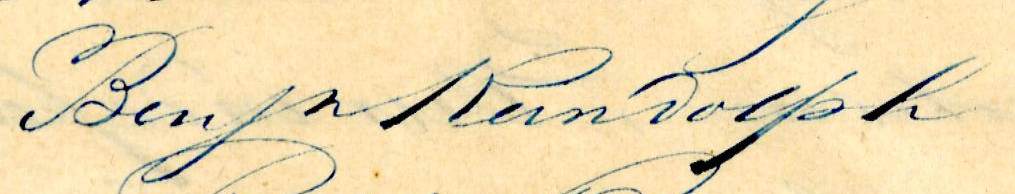Benjn Randolph
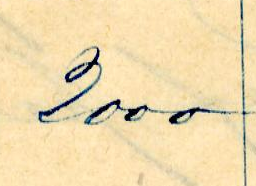2000
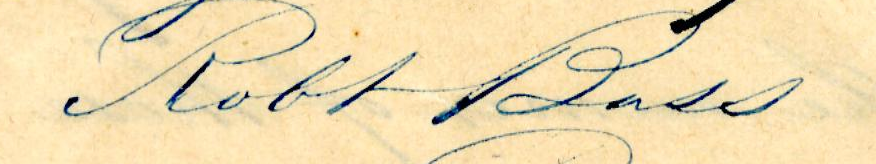Robt Bass
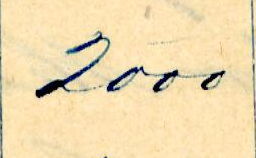2000
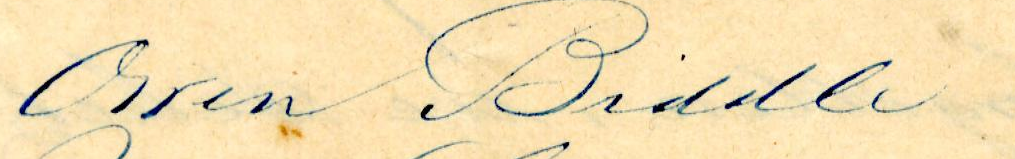Owen Biddle
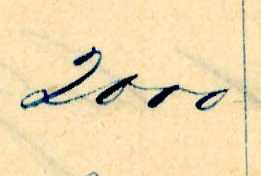2000
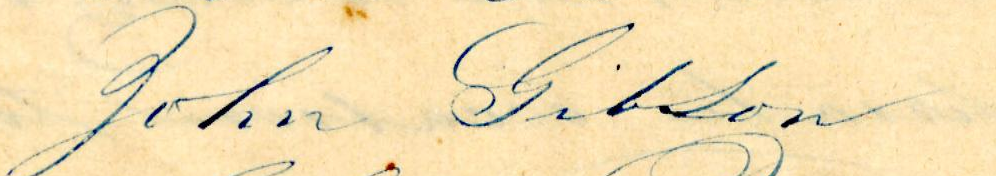John Gibson
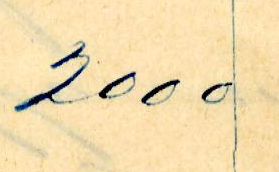2000
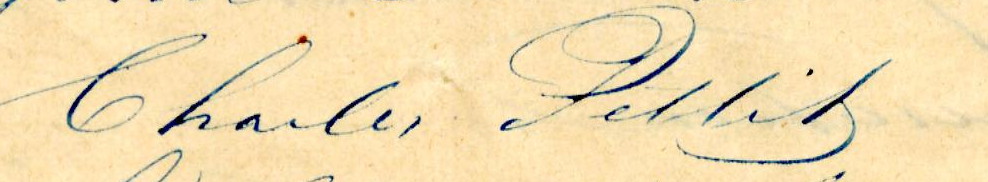Charles Pettit
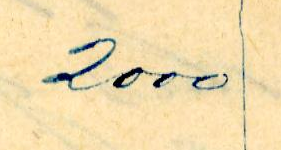2000
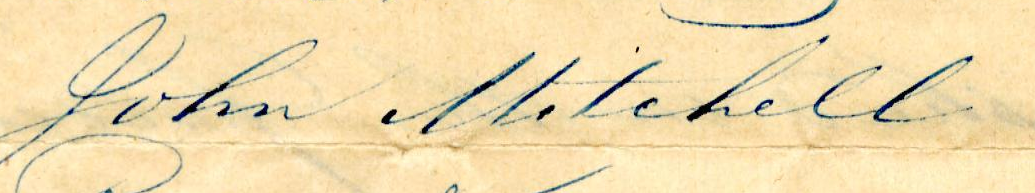John Mitchell
